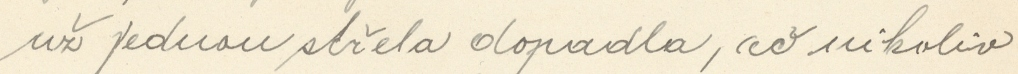už jednou střela dopadla, ač nikoliv
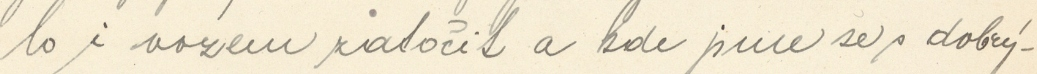lo i vozem zatočit a kde jsme se s dobrý-
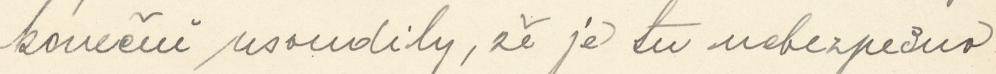konečně usoudily, že je tu nebezpečno
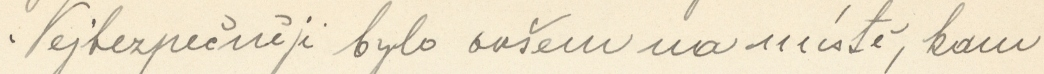Nejbezpečněji bylo ovšem na místě, kam
